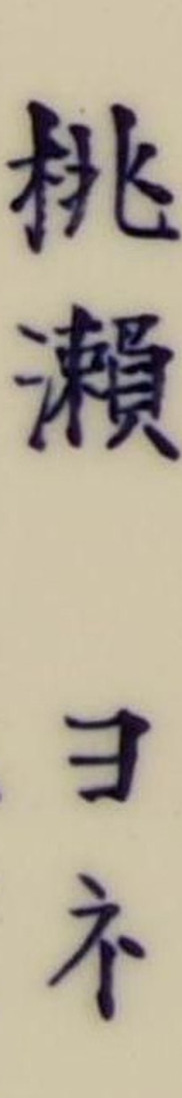桃瀬ヨネ
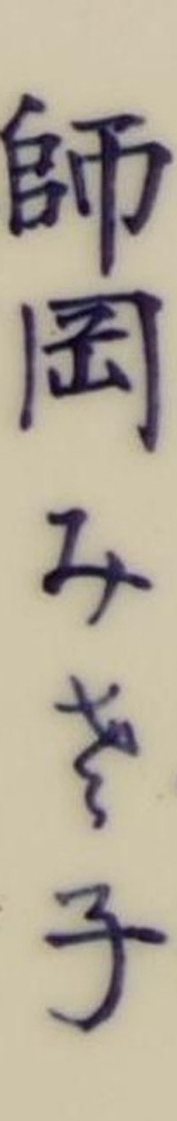師岡みさ子
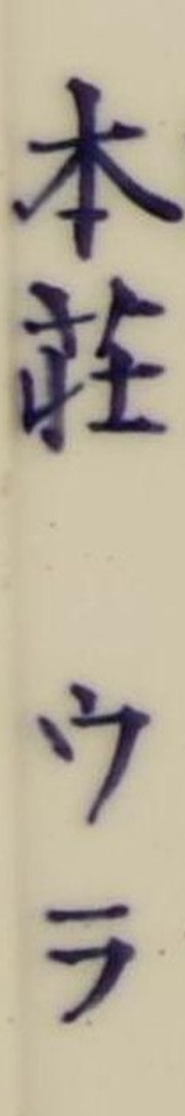本荘ウラ

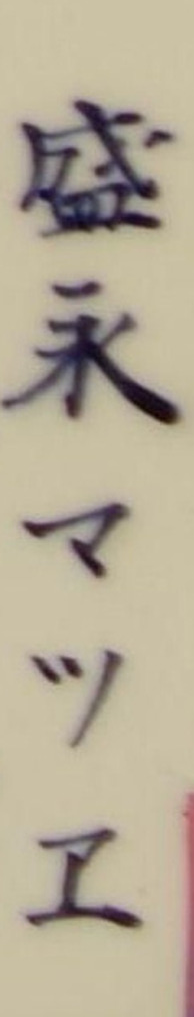盛永マツエ
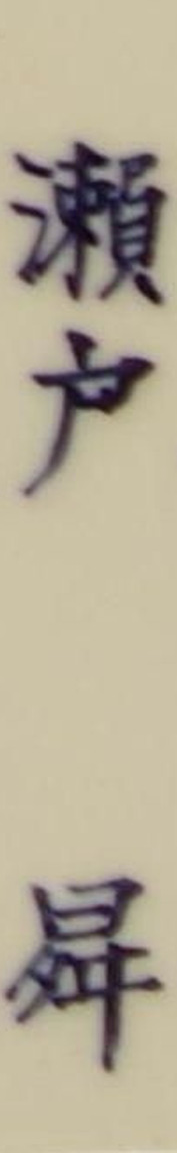瀬戸昇
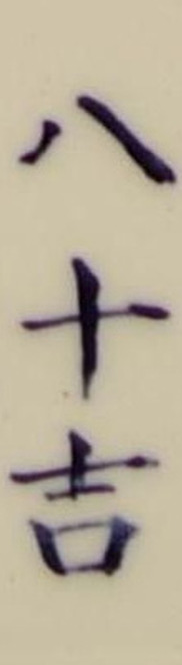八十吉
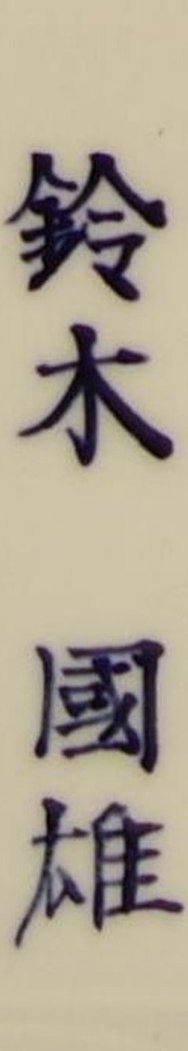鈴木國雄
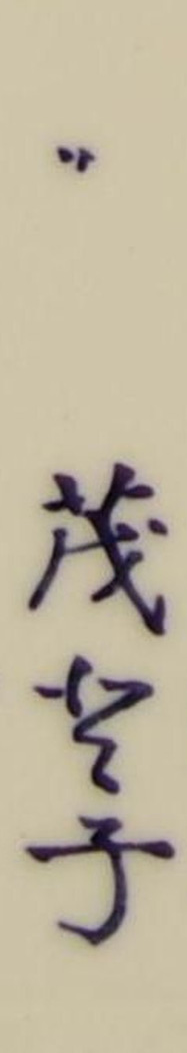茂と子
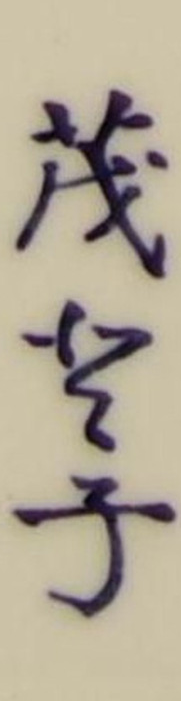茂と子
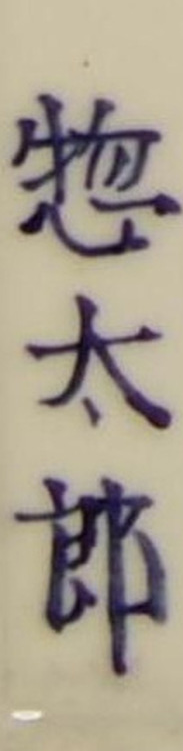惣太郎

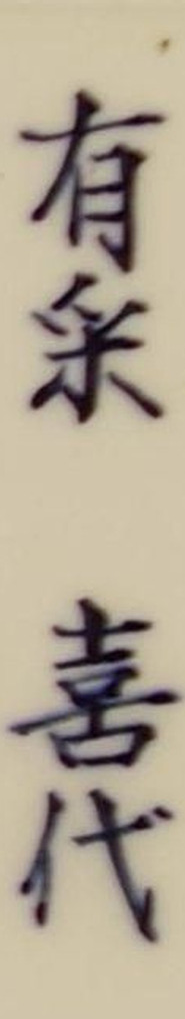有采喜代
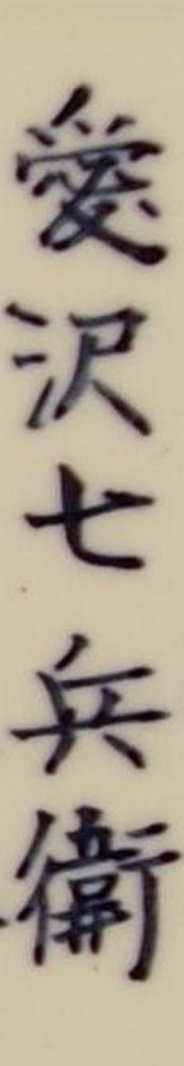愛沢七兵衛
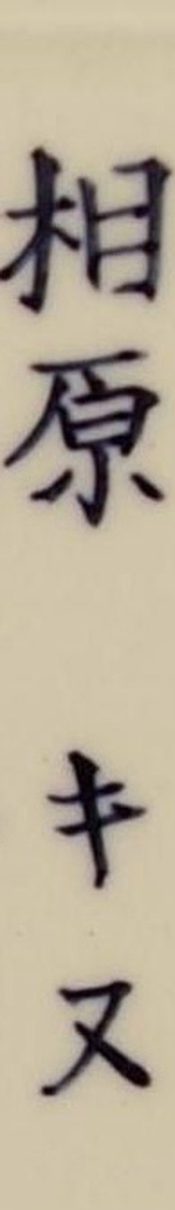相原キヌ
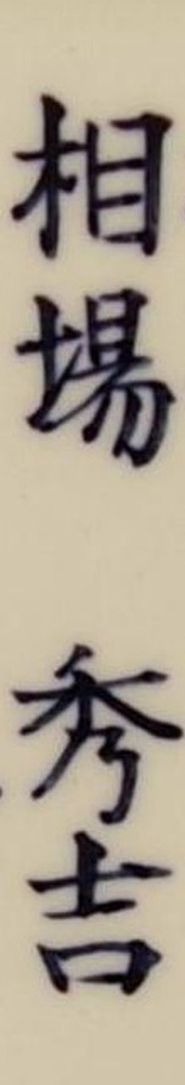相場秀吉
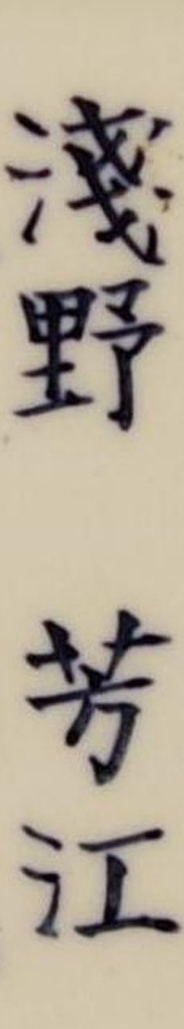浅野芳江
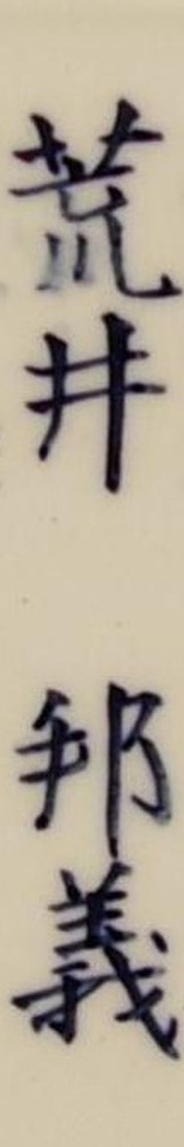荒井邦義
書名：E~L
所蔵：高野山金剛峯寺
